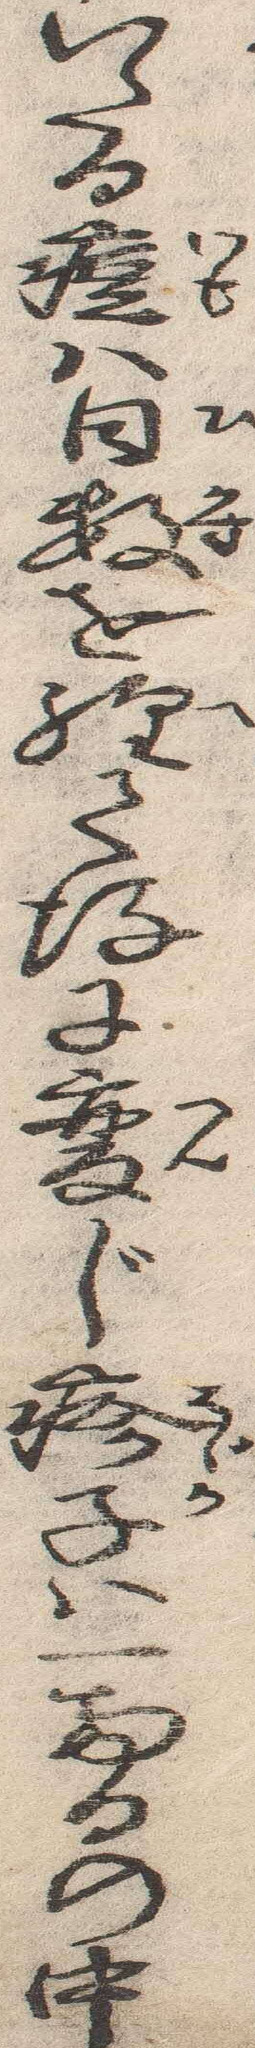いたる痘は日数を経て後に変じ疹子は一両日の中
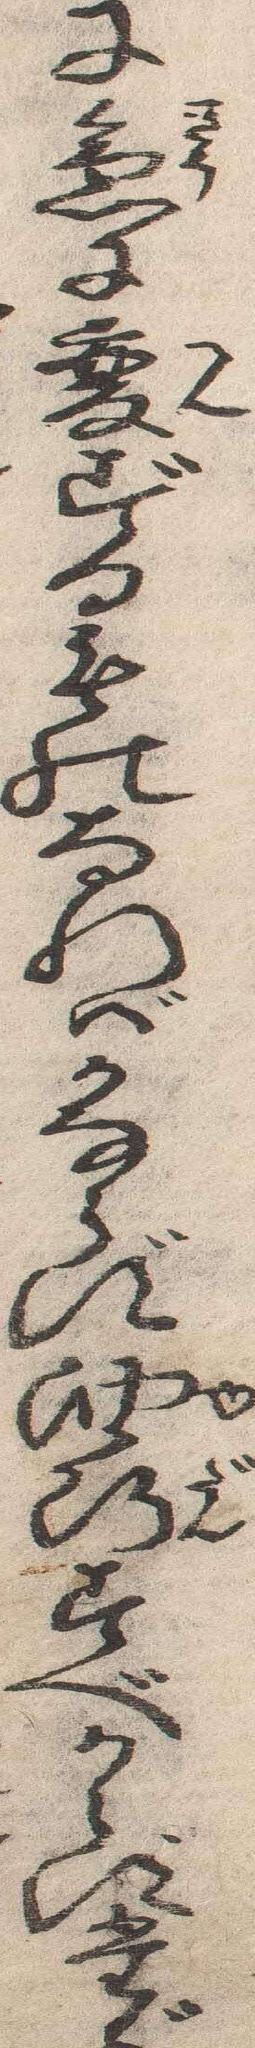に急に変ずるものなればかならず油断すべからずたゞ
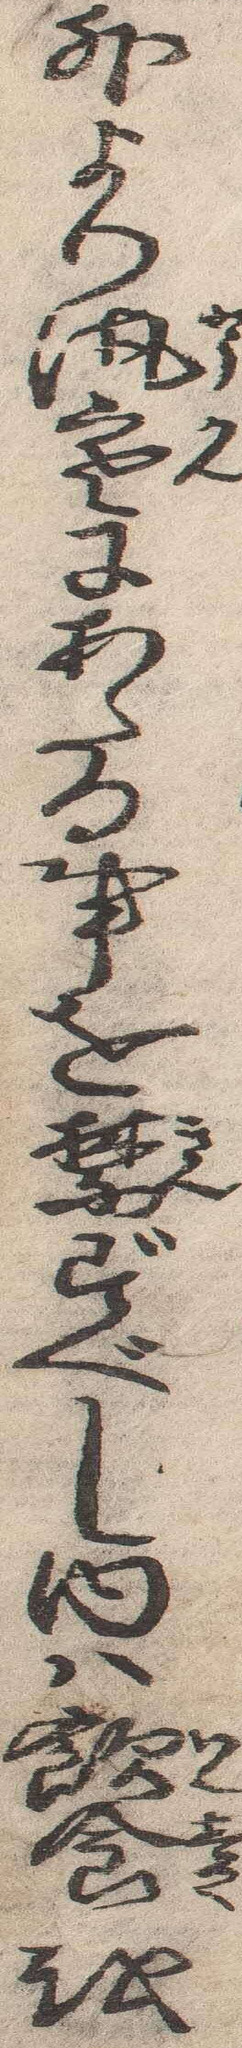外より風寒にあたる事を禁ずべし内は飲食を

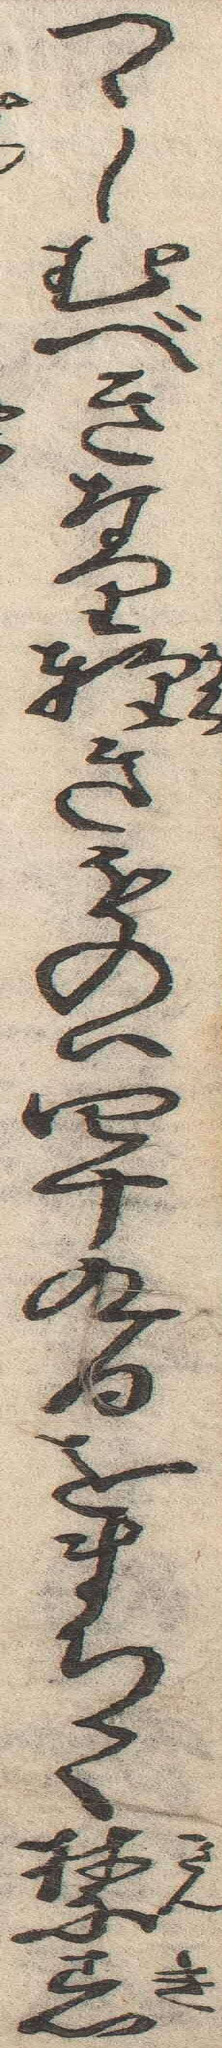つゝしむべきなり軽きものは四十九日をまちて禁忌
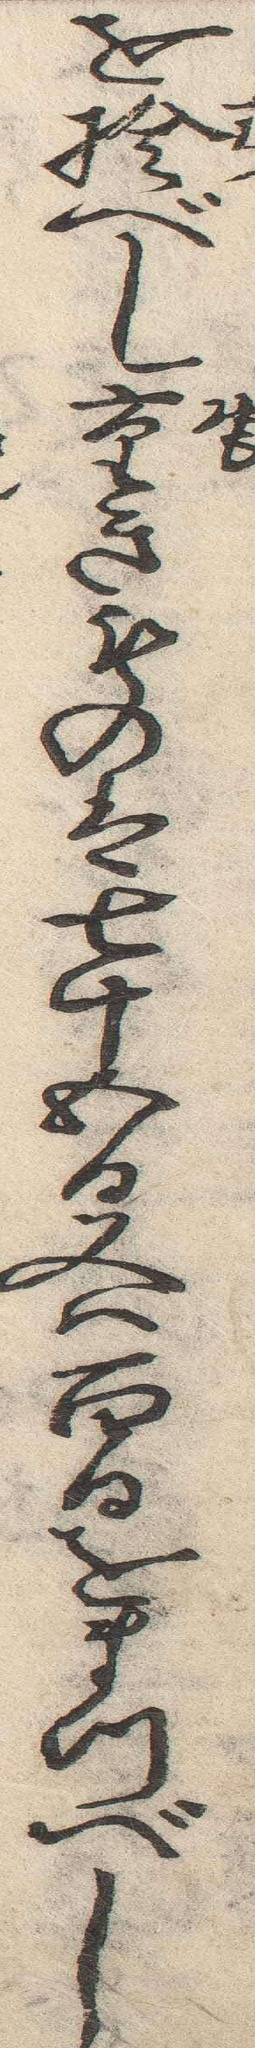を捨べし重きものは七十五日又は百日をまつべし
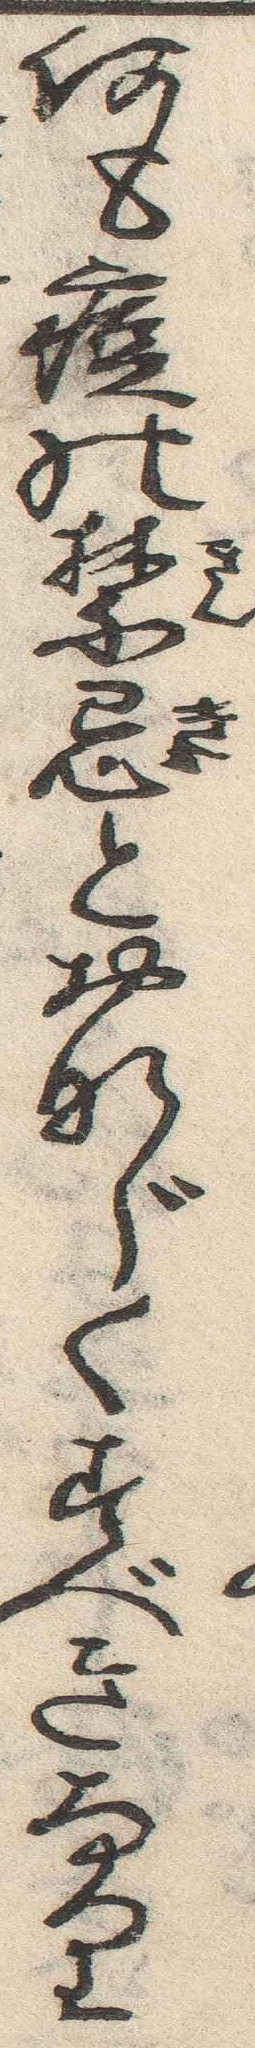何も痘の禁忌とおなじくすべきなり
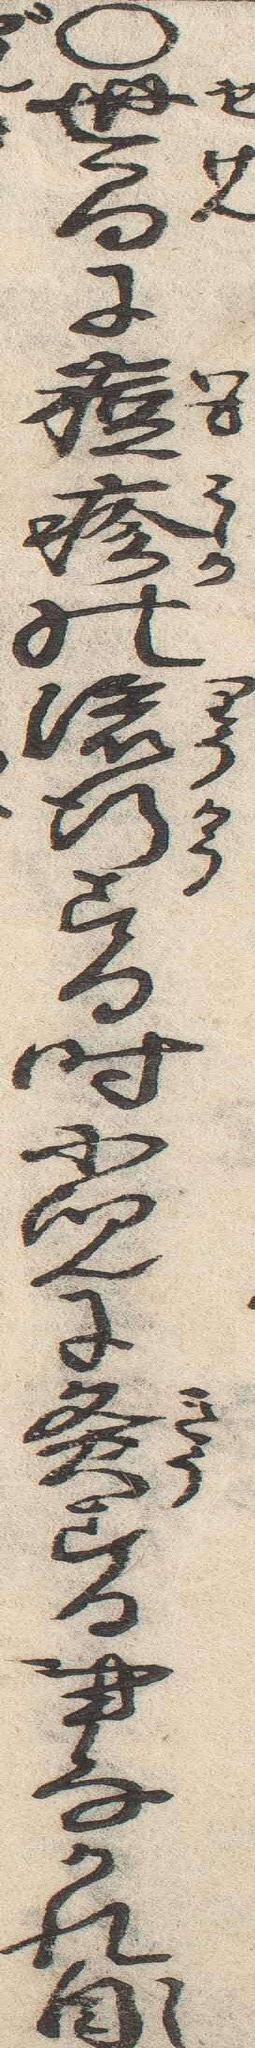○世間に痘疹の流行する時小児に灸する事なかれ自
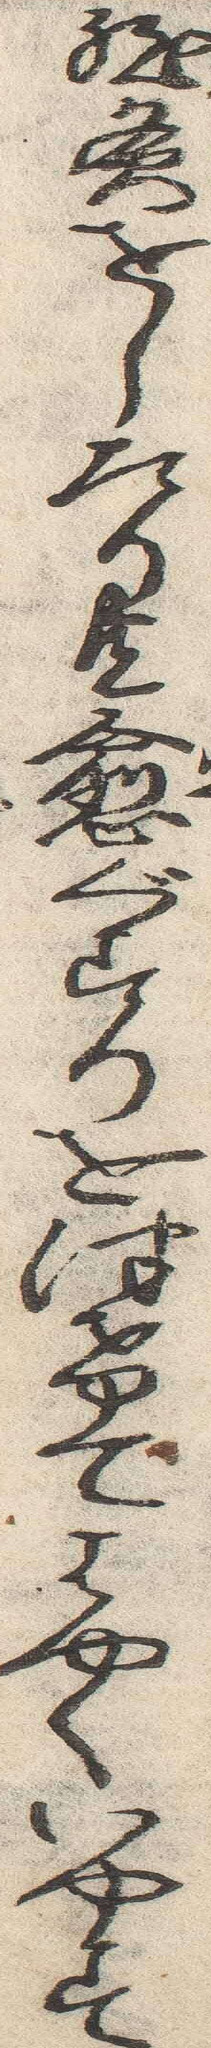然灸をしたり共愈ぐすりをつけてはやくいやす
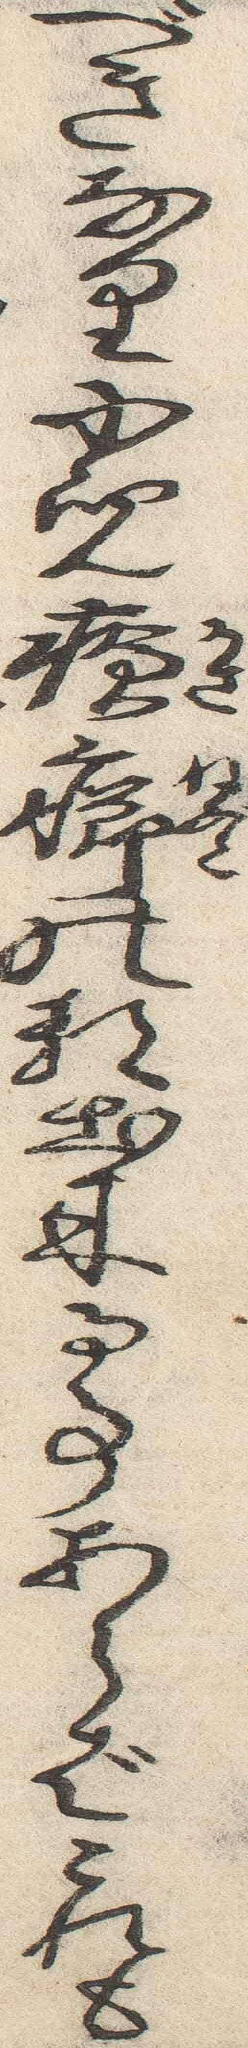べきなり小児瘡癤の類出来る事あらばこれも
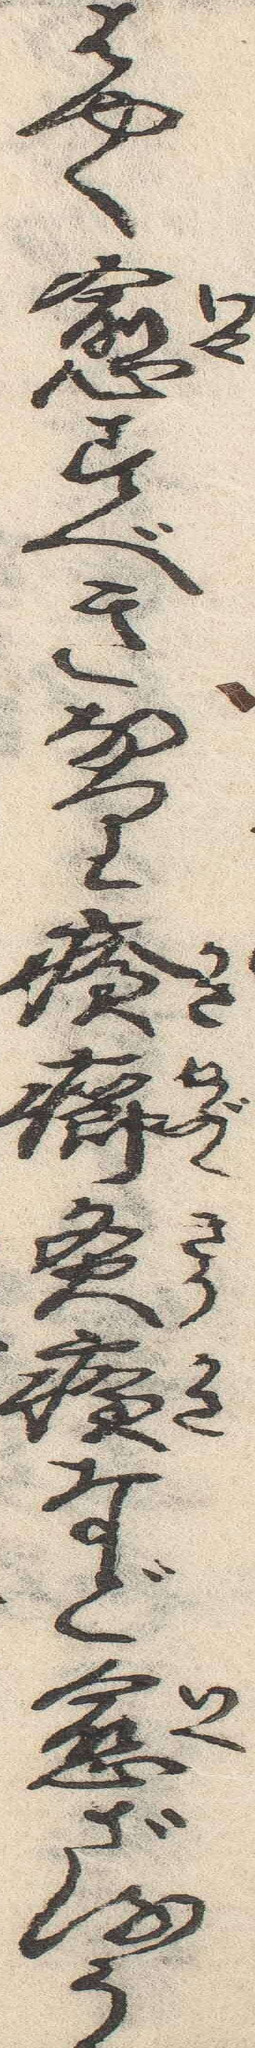はやく愈すべきなり瘡癤灸瘡など愈ざるう
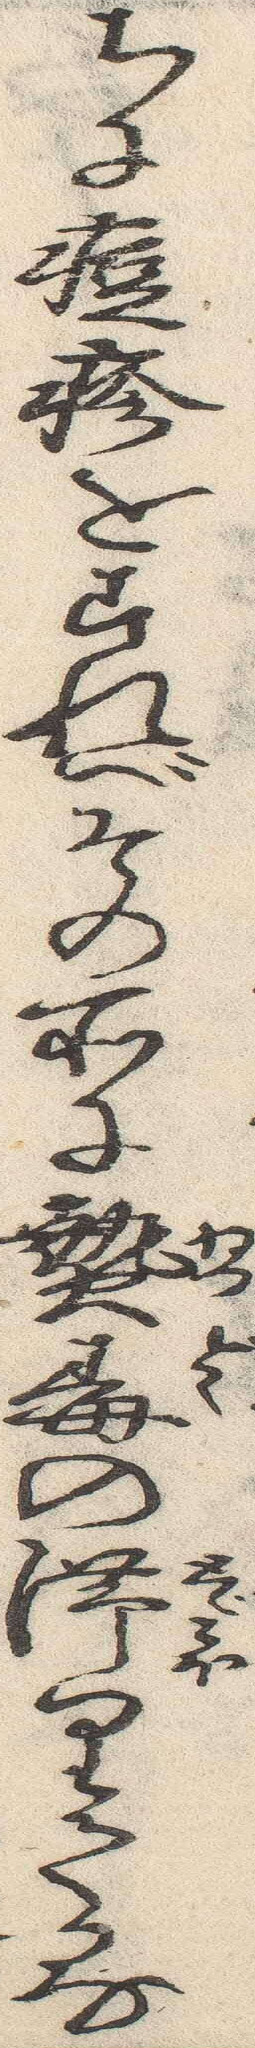ちに痘疹をすればその所に熱毒の滞りてかな
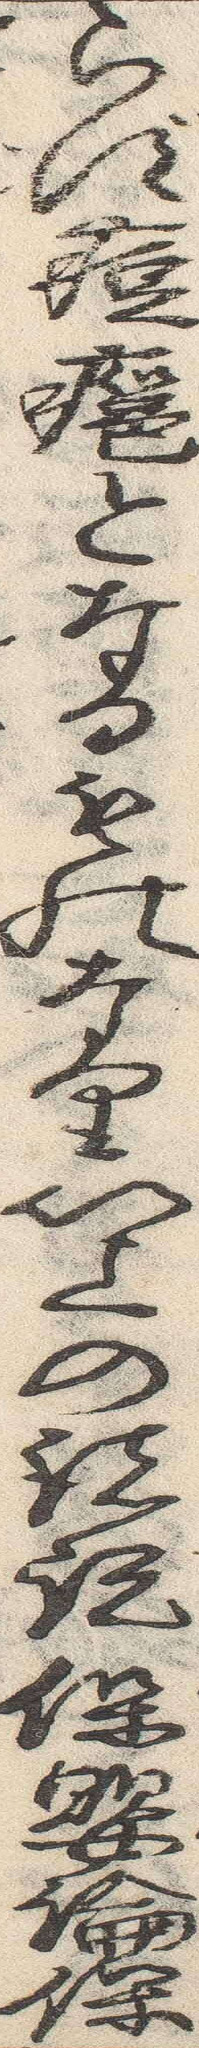らず痘となるものなり以上の諸説保嬰論保
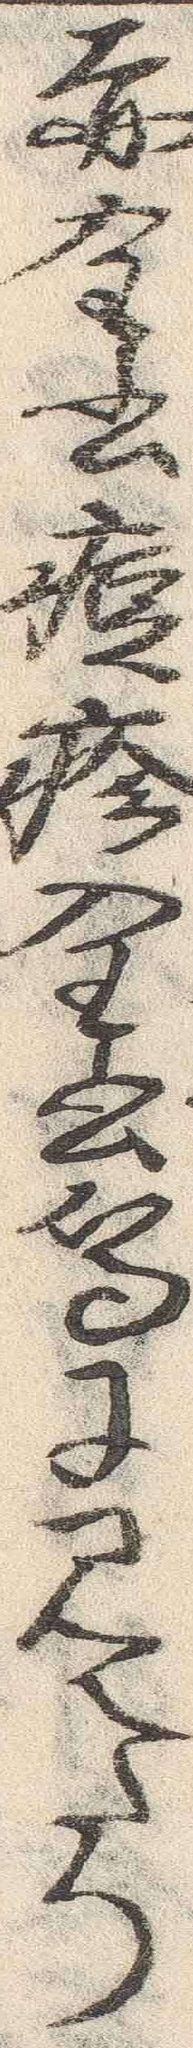赤全書痘疹全書等に見えたり
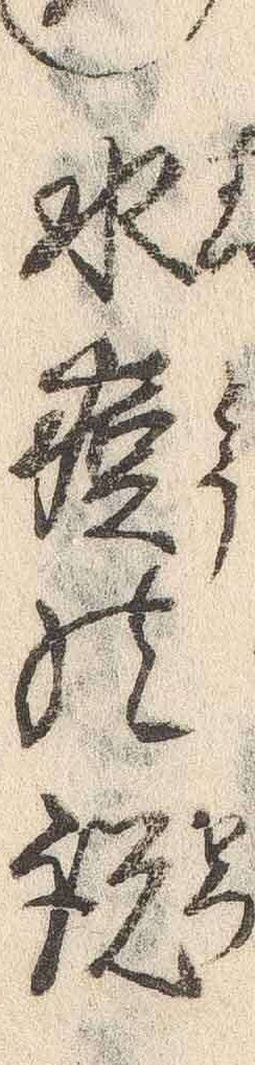㊅水痘の説
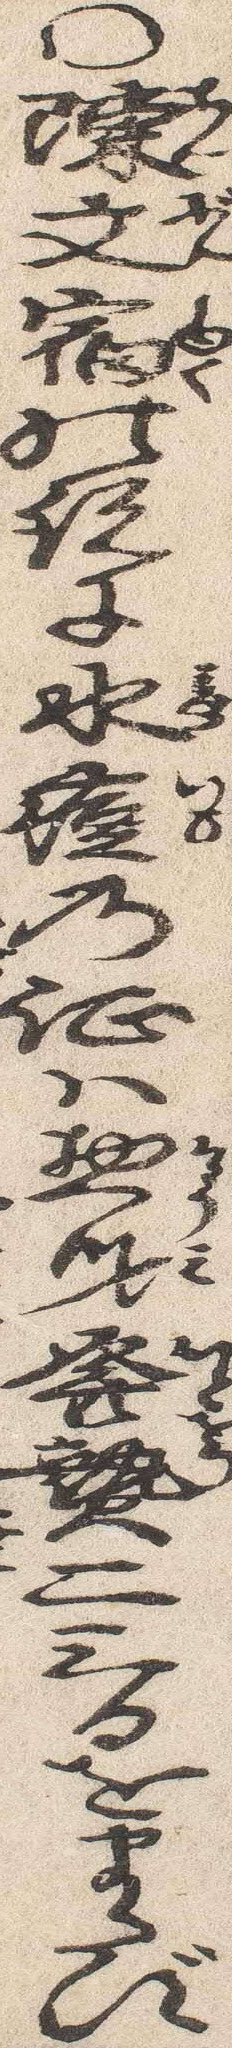○陳文宿の説に水痘の証は総身発熱二三日をまたず
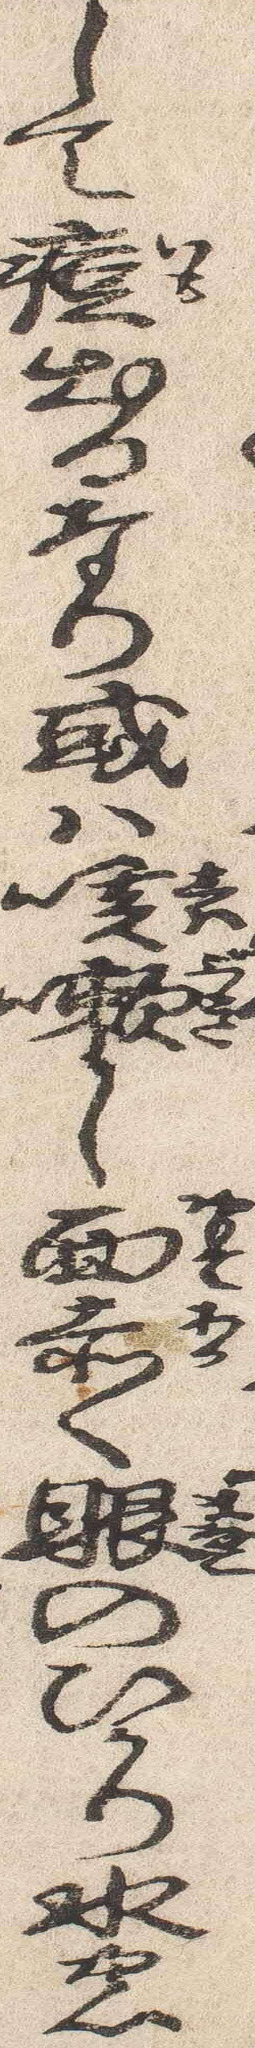して痘出るなり或は咳嗽し面赤く眼のひかり水の
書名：小児必用養育草
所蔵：東京学芸大学附属図書館 国文学研究資料館
